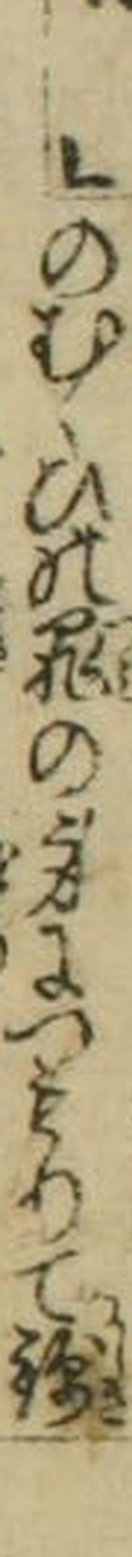のむくひの罪の身につもりて錦
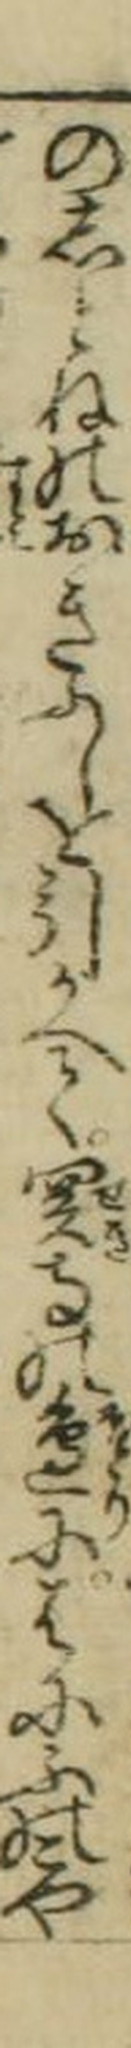のしとねのおきふしを引かへて。関寺の辺に。はにふのこや
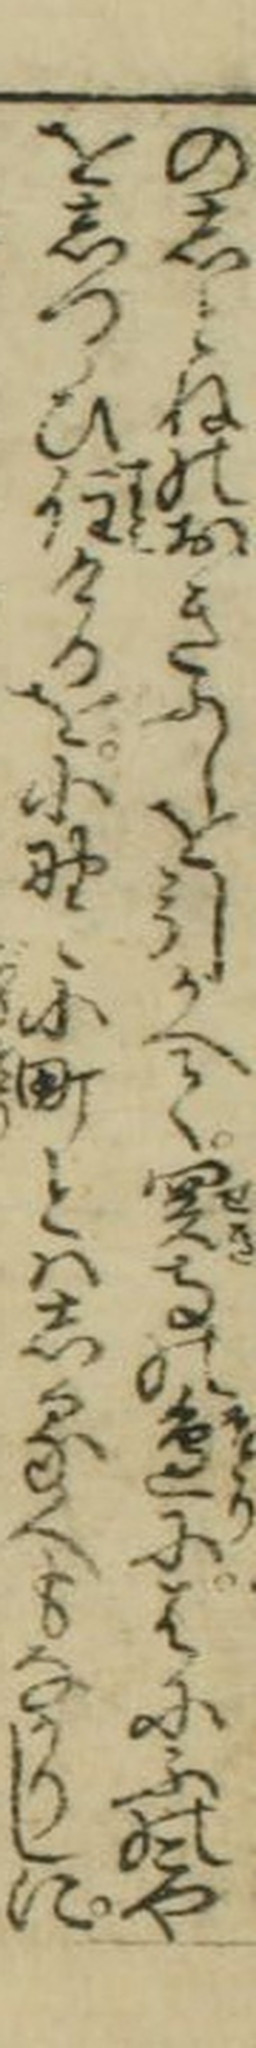をしつらひ住けるを。小野ゝ小町とはしる人もなかりしに。
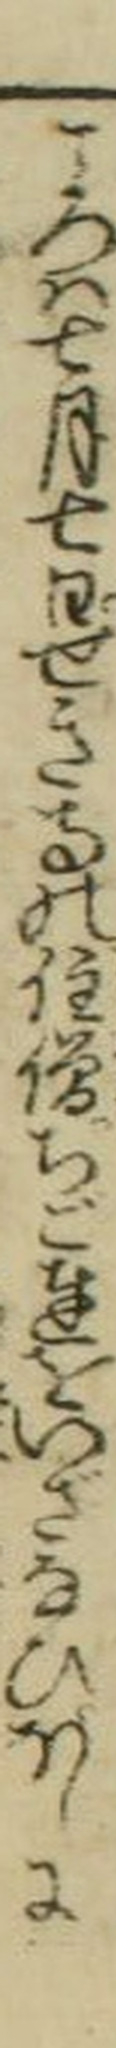ころは七月七日。せき寺の住僧。ちご達をいざなひ。ほしに
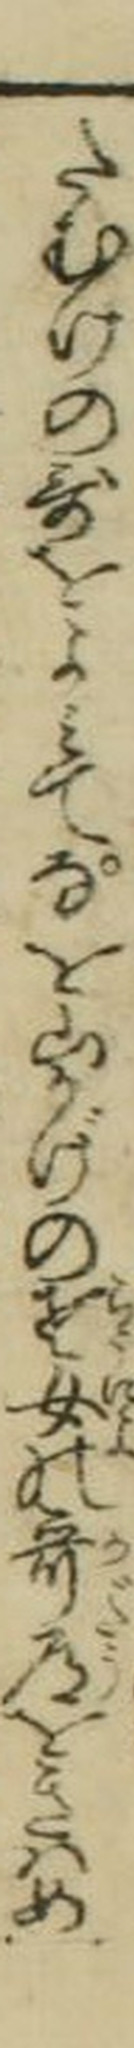たむけの哥をよみて。なを山かげの老女の哥道をきはめ
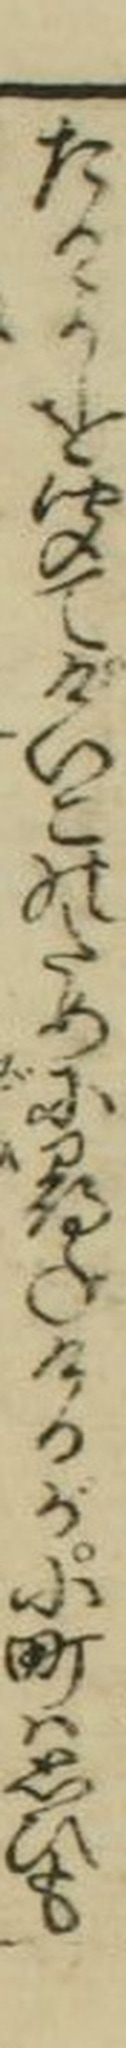たるよしを聞て。けいこのために尋ねけるが。小町は思ひも
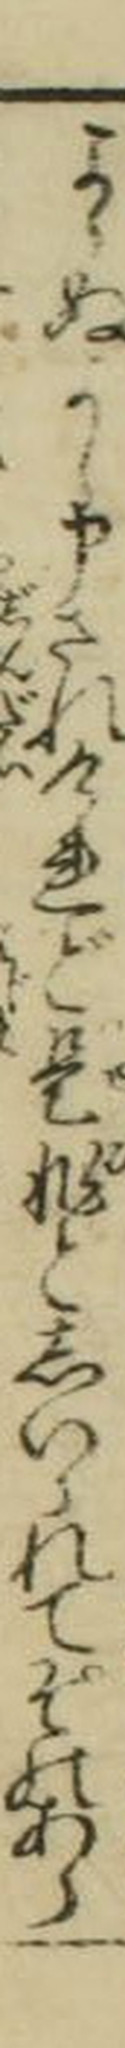よらぬよし申されけれど是非としいられて。そのあら
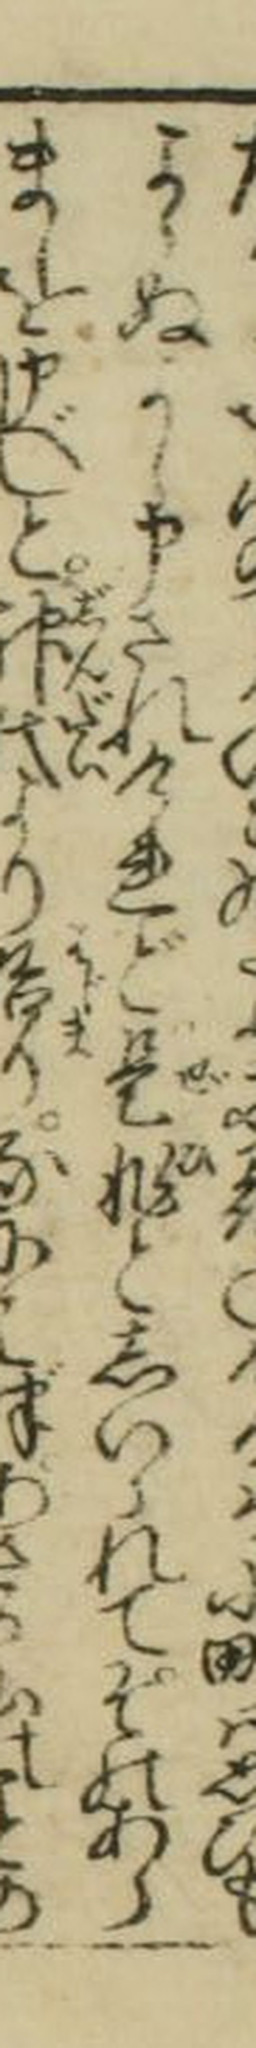ましを申べしと。神代より始り。なにはづあさか山のことの
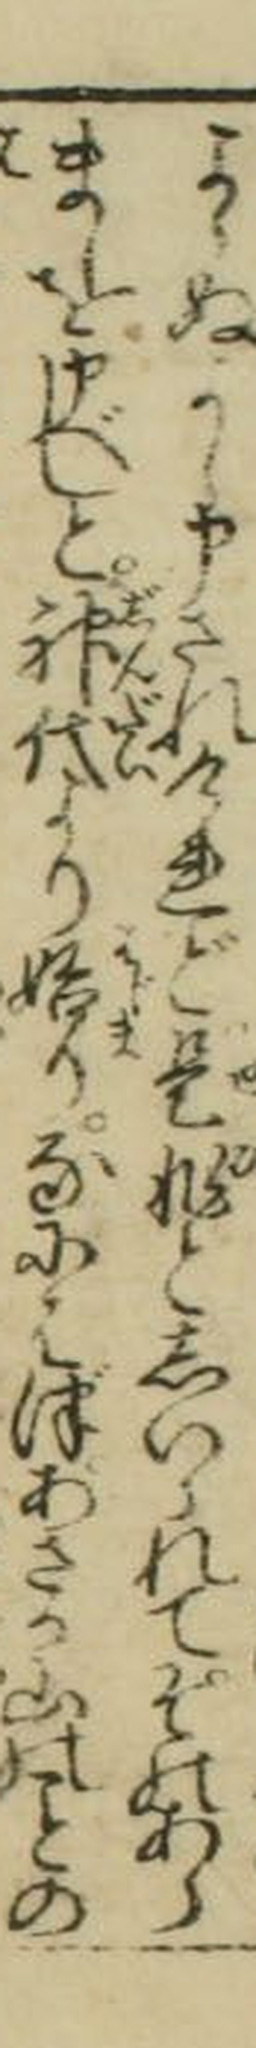ましを申べしと。神代より始り。なにはづあさか山のことの
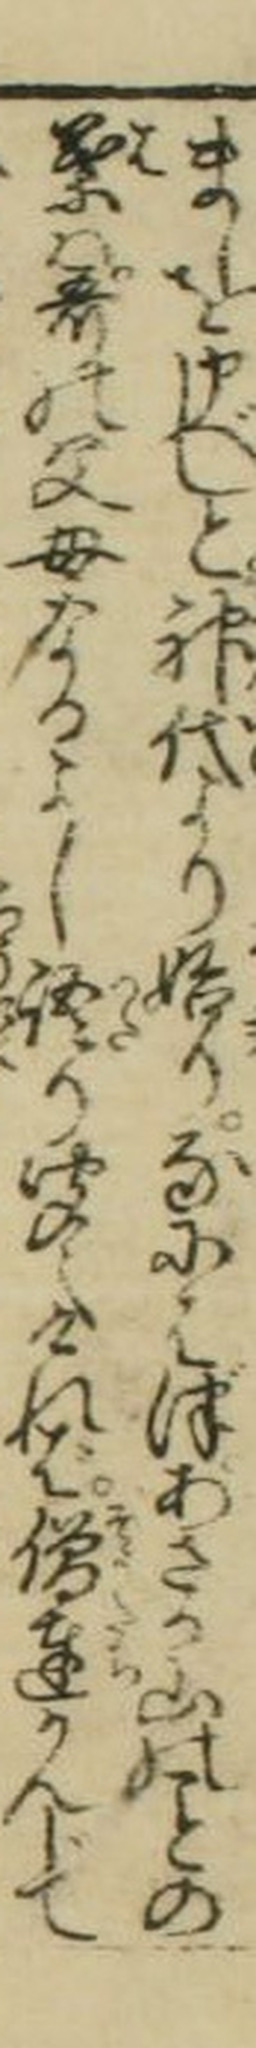葉は。哥の父母なるよし語り聞へければ。僧達かんじて
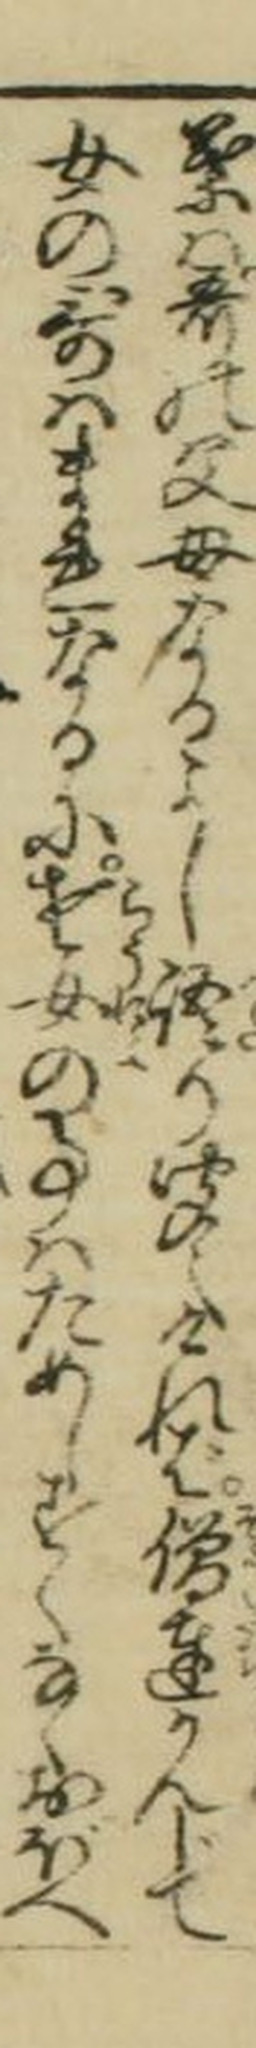女の哥はまれなるに。老女の事はためしすくなくおぼへ
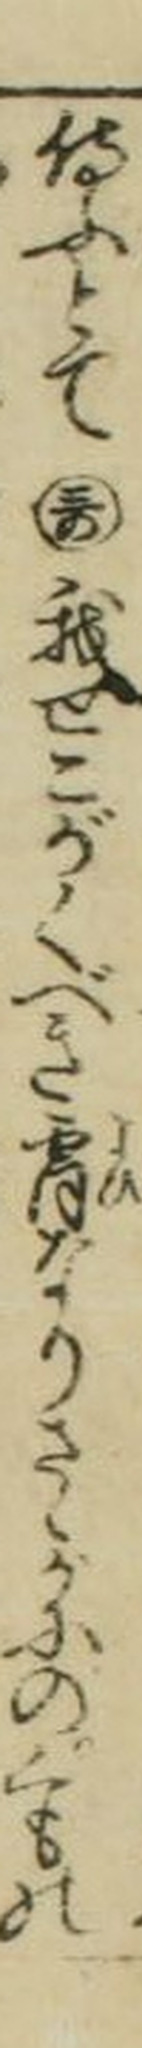侍ふとて哥我せこがくべき宵なりさゝがにの。くもの
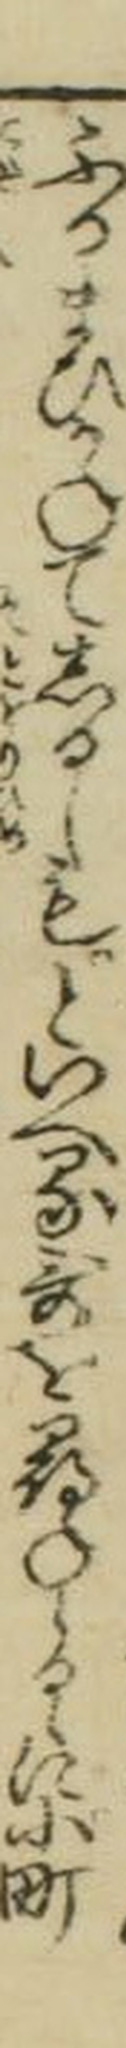ふるまひかねてしるしも。といへる哥を尋ねしるゝに小町
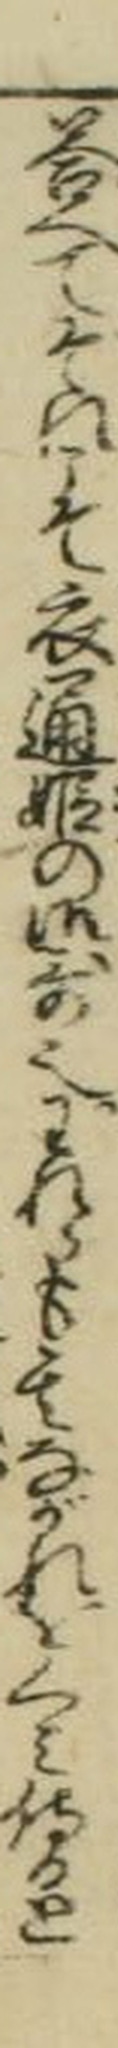答へてそれこそ衣通姫の御哥也。われらも其ながれをくみ侍ると
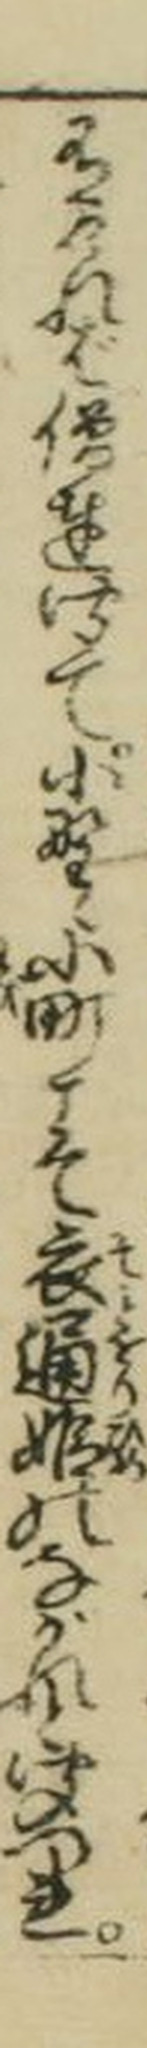有ければ僧達聞て。小野小町こそ衣通姫のながれと聞つれ。
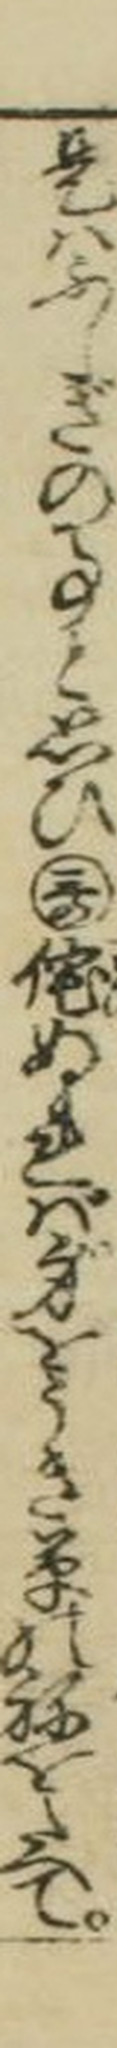是はふしぎの事と思ひ哥侘ぬれば身をうき草のねをたへて。
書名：女源氏教訓鑑
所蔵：東京学芸大学附属図書館
